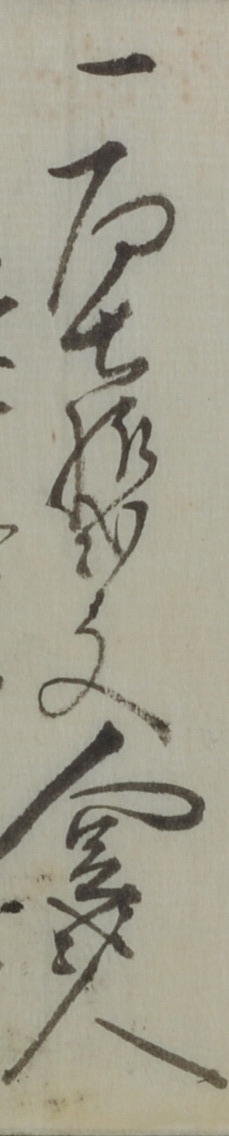壱百七十二文人足弐人
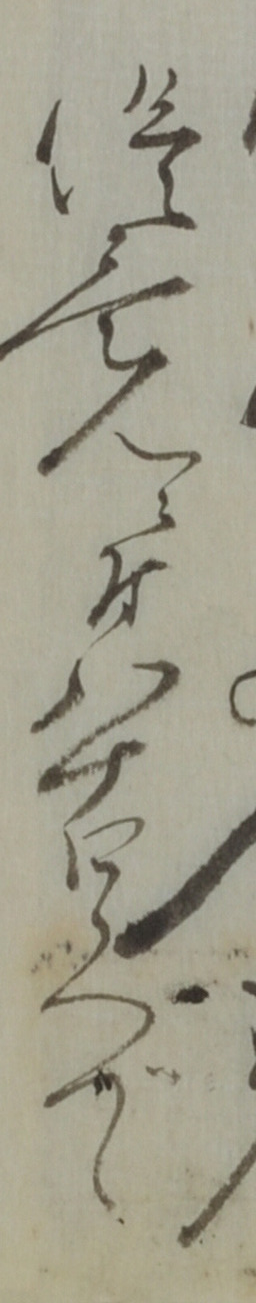但壱人ニ付八十四文づゝ
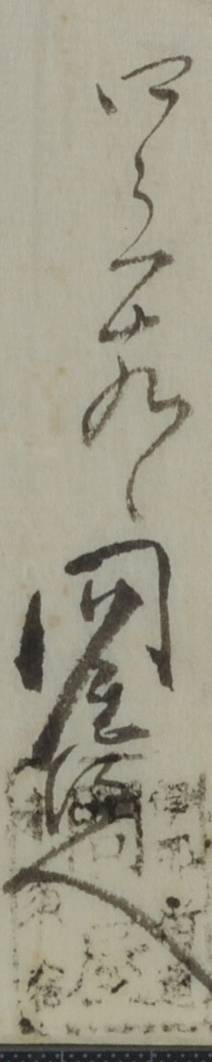四月十九日問屋役人

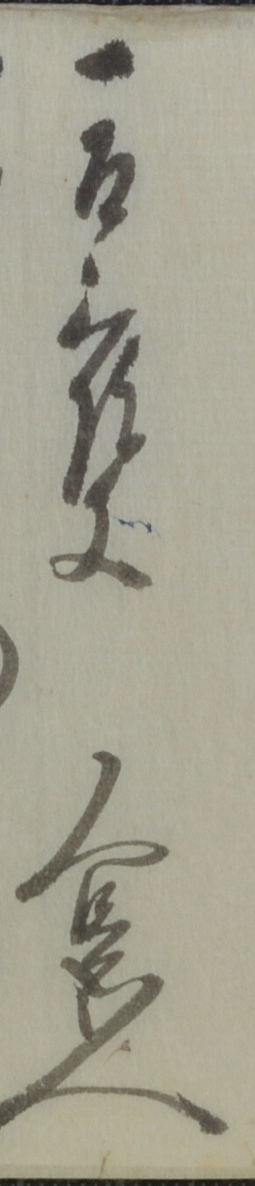一三拾文人足五人
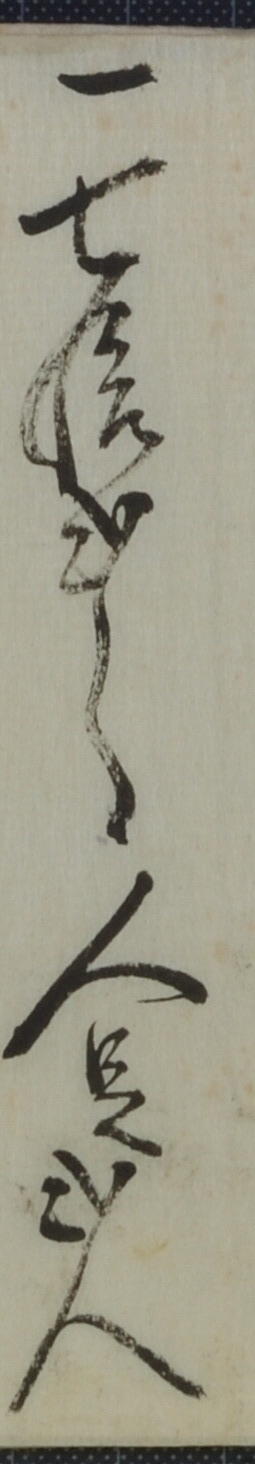一七拾弐匁人足弐人
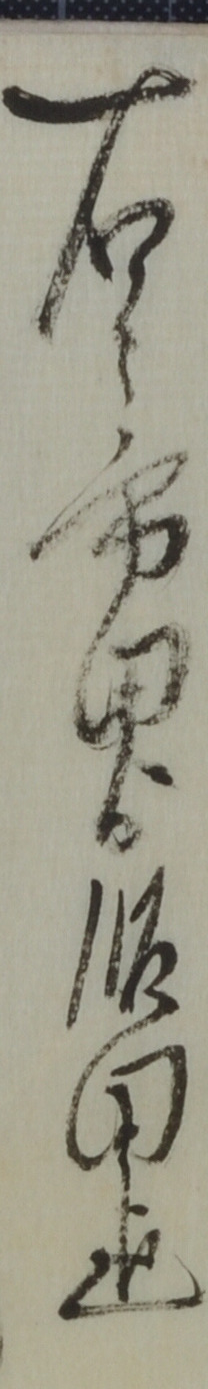右は市田より飯田迄
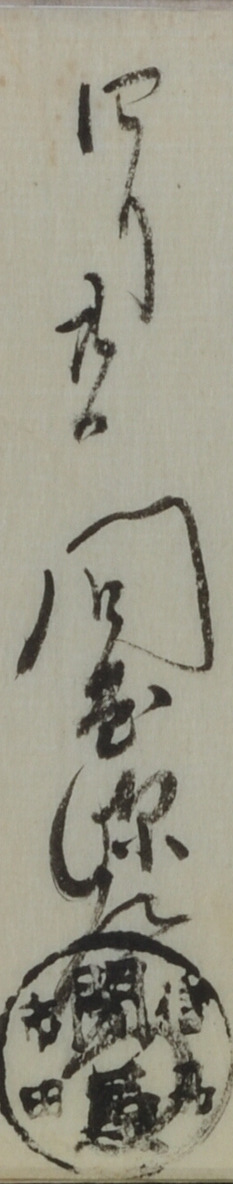四月廿日問屋源兵衛
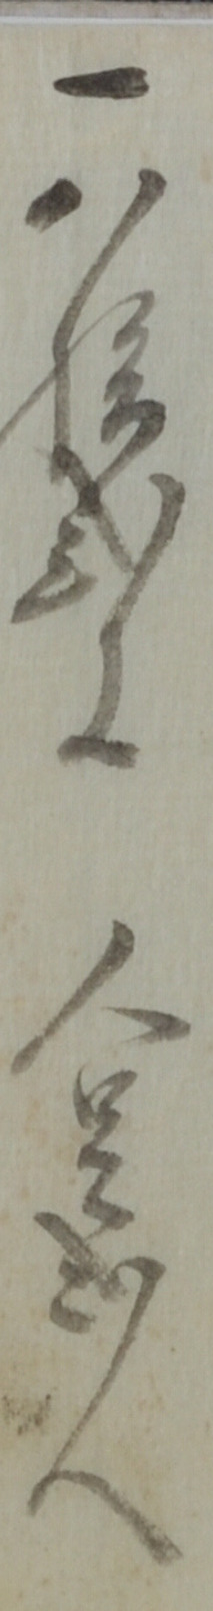一八拾弐匁人足弐人
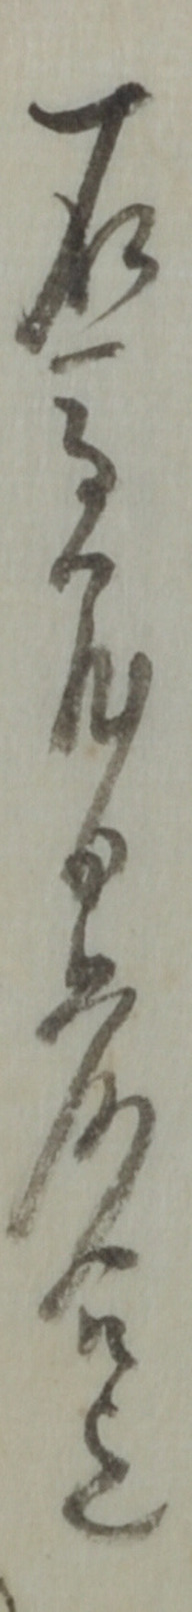右馬屋ゟ落合迄

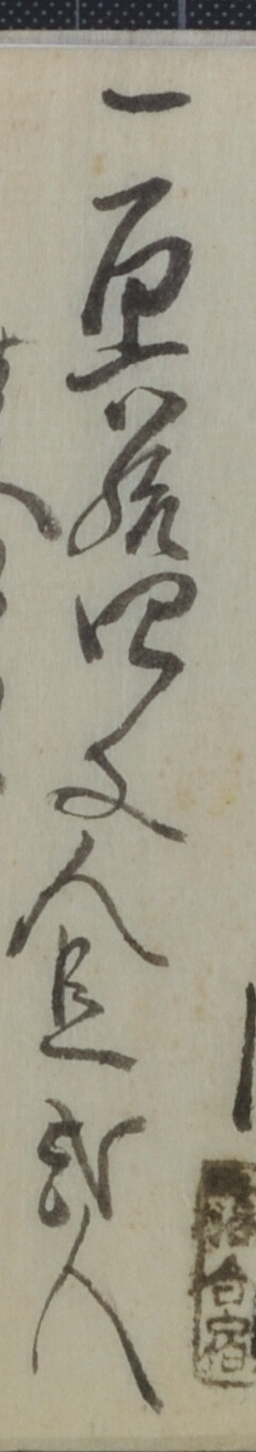一百六拾四文人足弐人
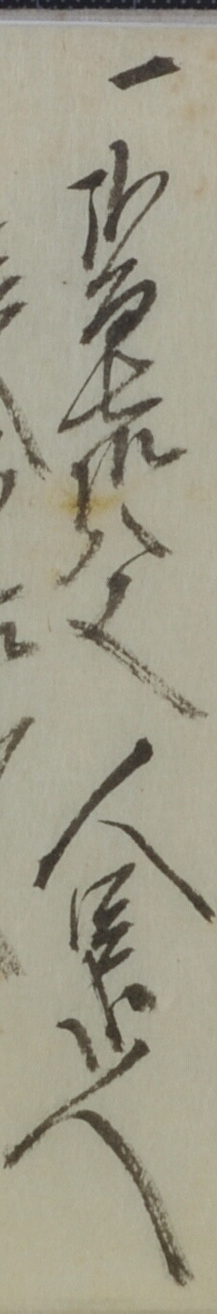一弐百七拾八文人足弐人
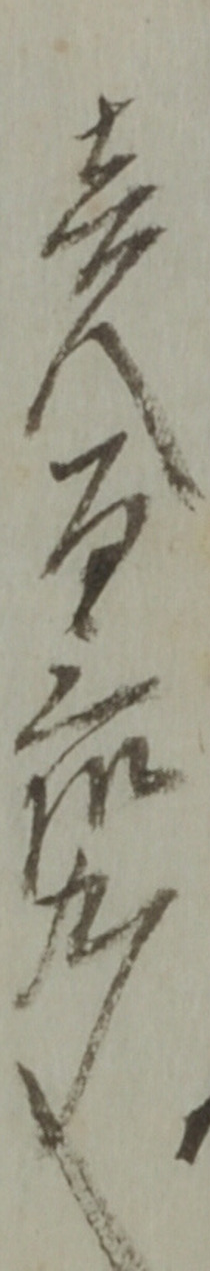壱人百三拾九文
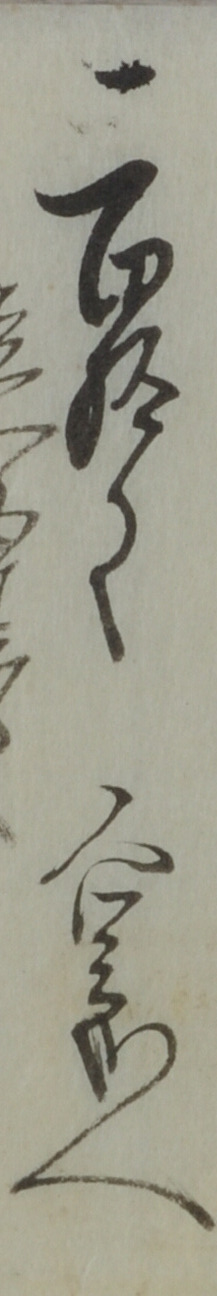一百拾匁人足弐人

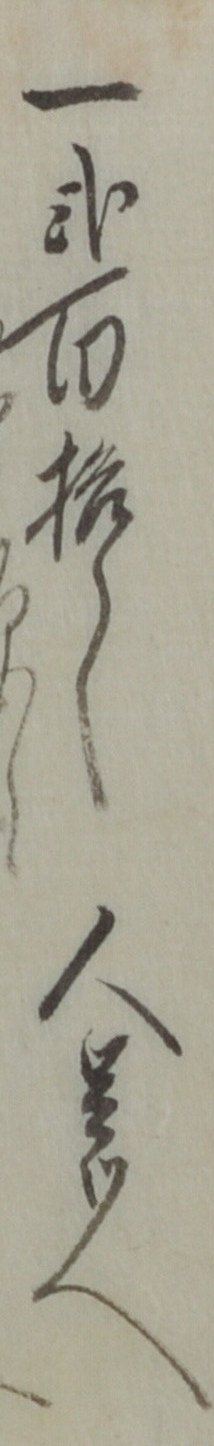一弐百拾匁人足同人
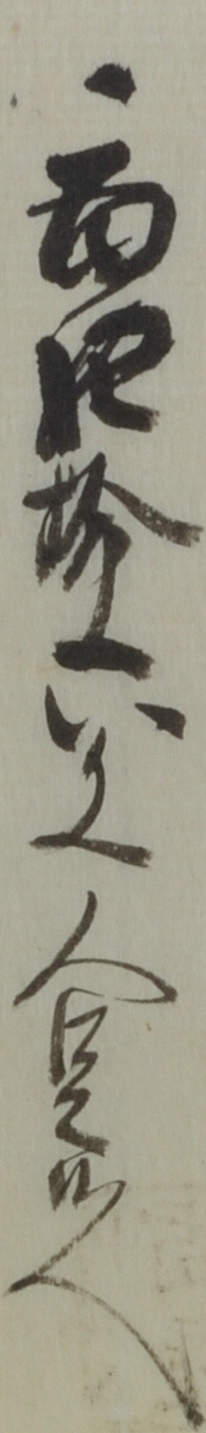一百四拾六文人足同人
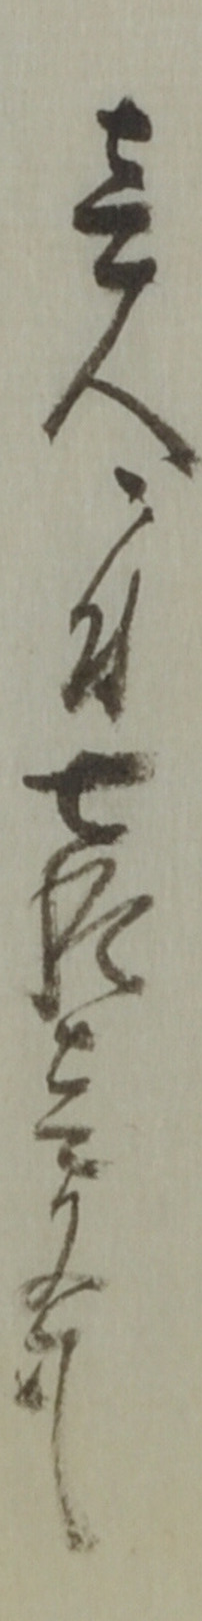壱人ニ付七拾壱文
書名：従信州高遠京都迠人馬駄賃帳
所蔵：伊那市立高遠町図書館・合同会社AMANE
